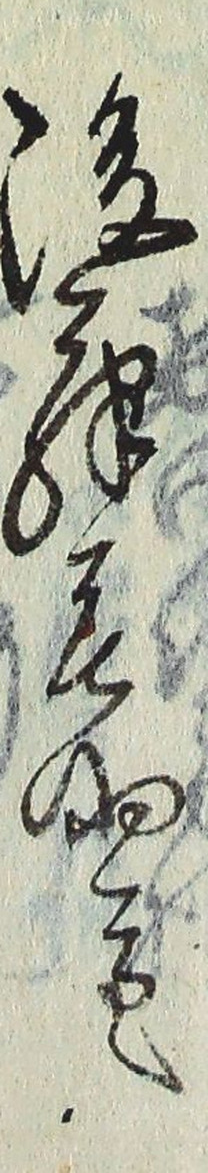後藤庄助方へ
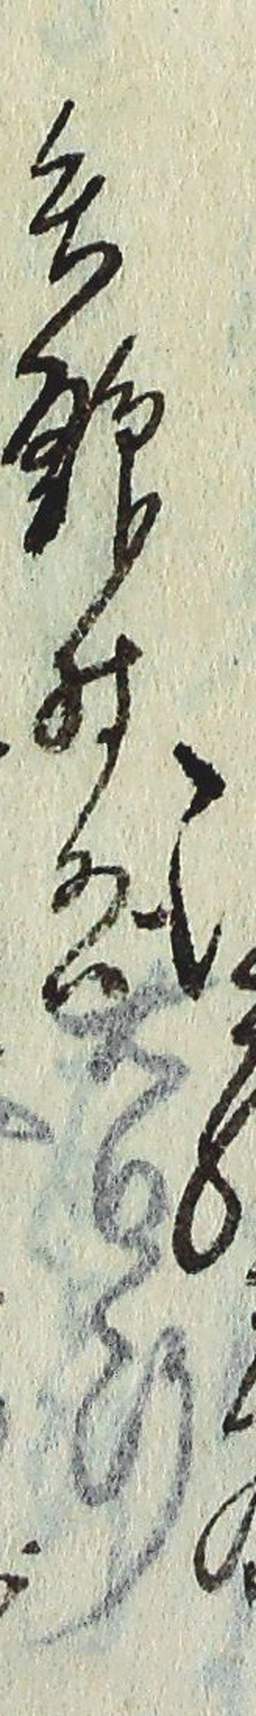矢野村右同
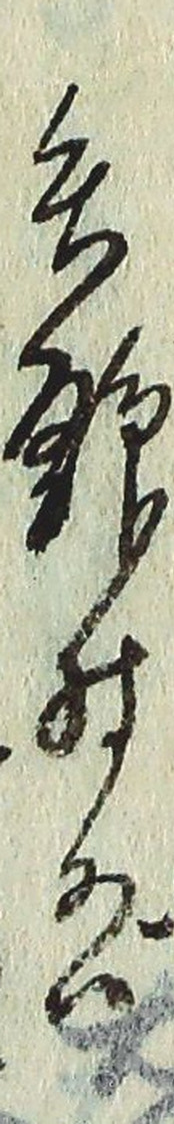矢野村右同
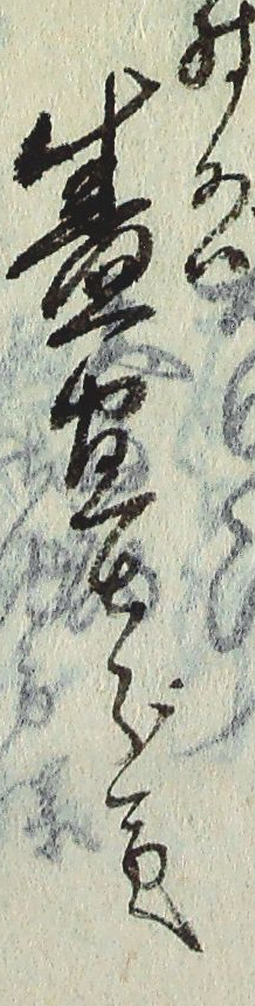盛宣七郎方へ
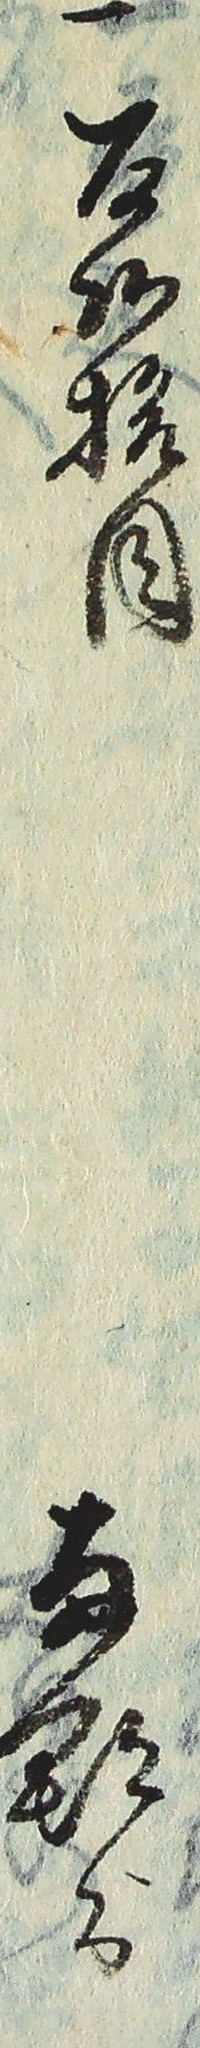一百弐拾目両郡分
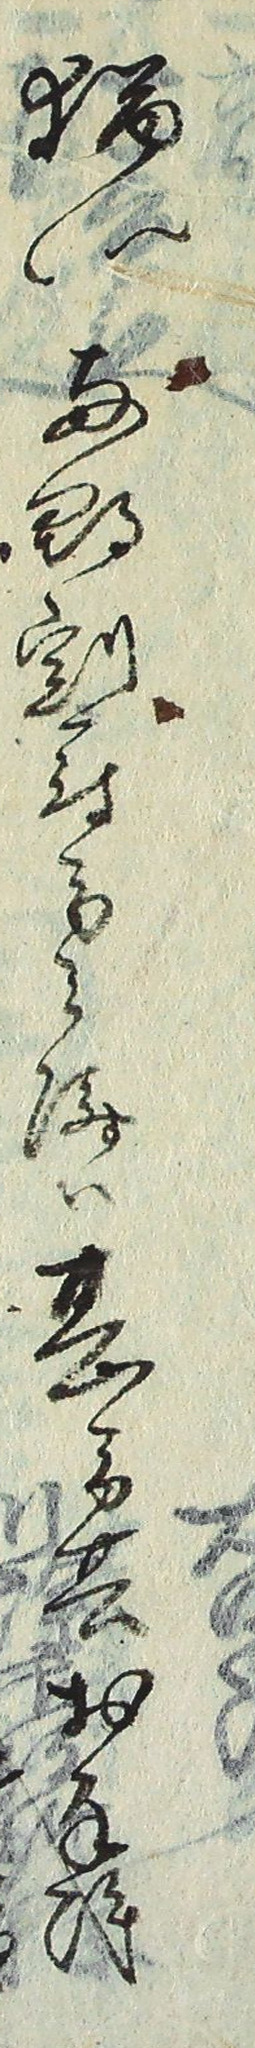猶以両郡割苻方之儀は其方共於手許
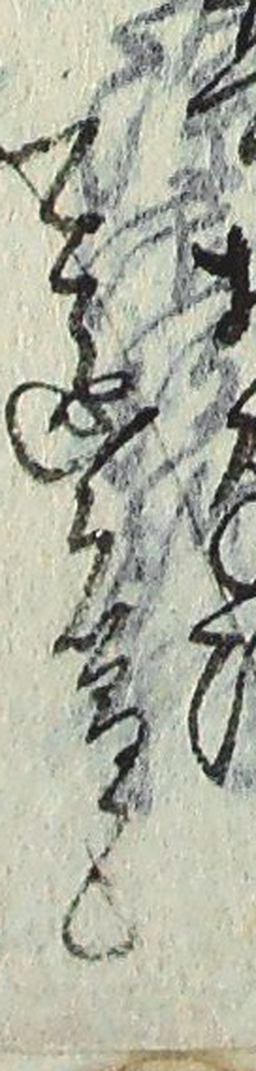可遂了簡候以上
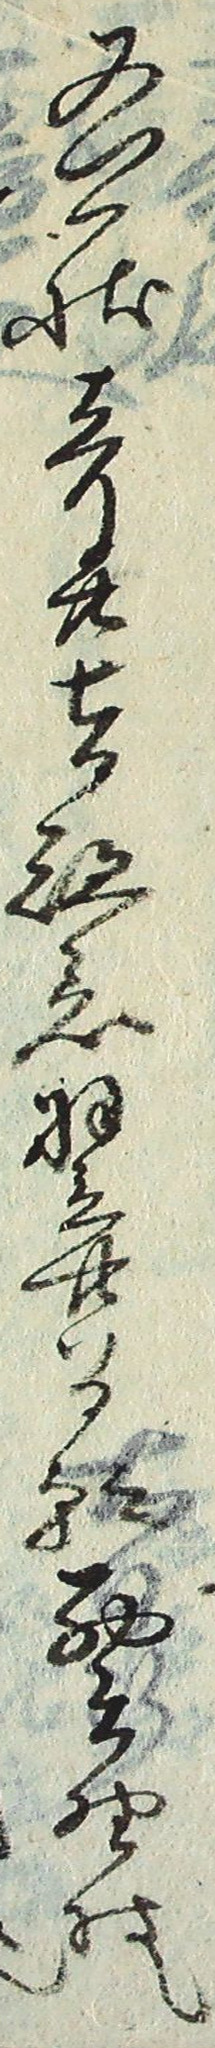右御状十二月廿七日夜着翌廿八日朝西矢野村へ
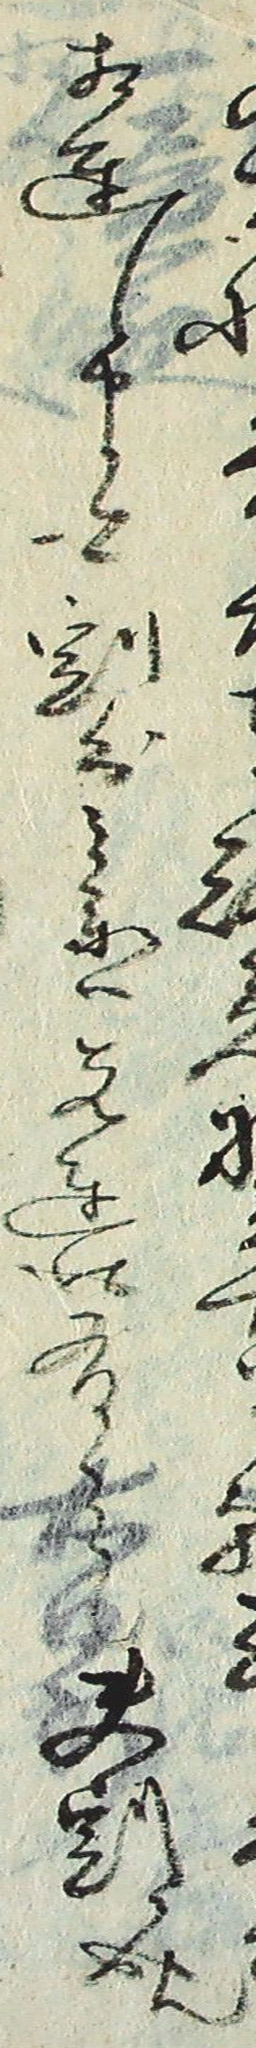相達し申候以上割分之義は先達仕有之候夫割に成る

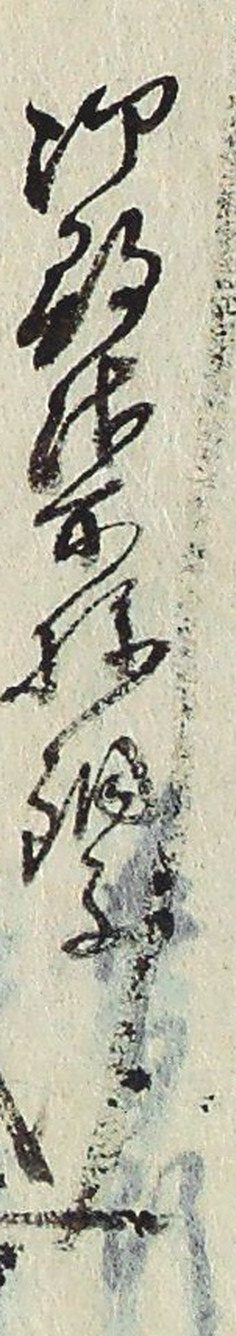御郡代所様銅子
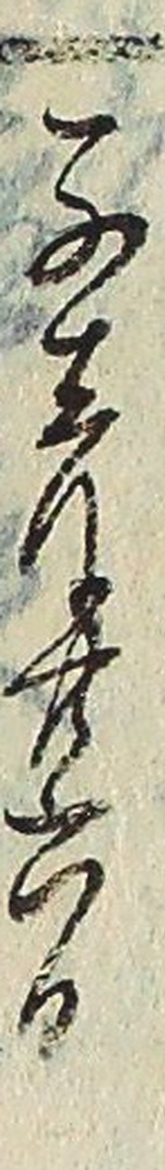子十二月廿六日
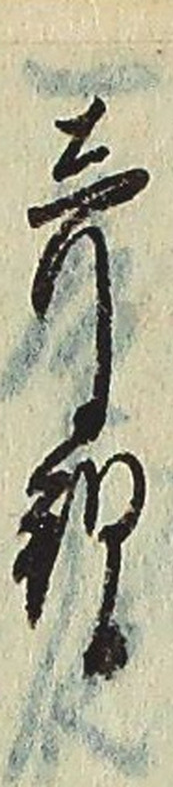十二月朔日
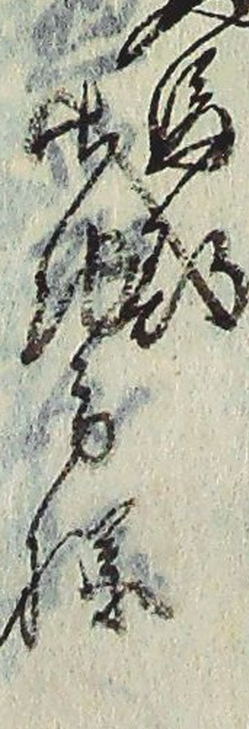御地方様
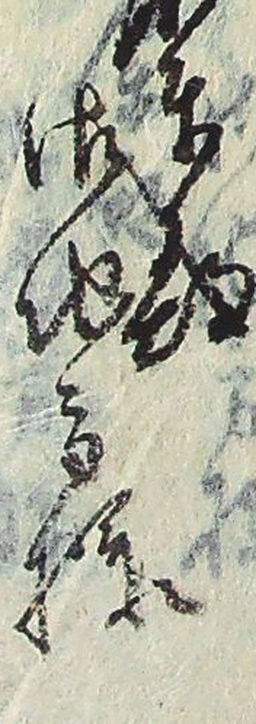御地方様

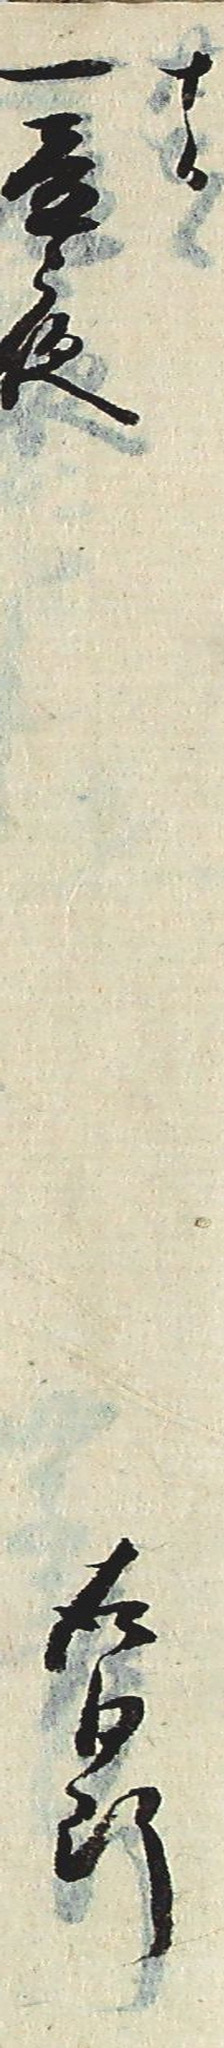一昼夜右同断
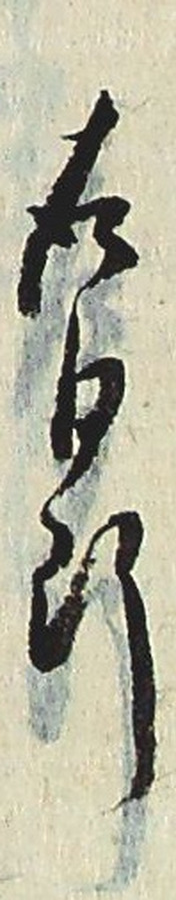十九日
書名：名東郡中諸割賦元帳
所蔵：鳴門教育大学 Naruto University of Education
